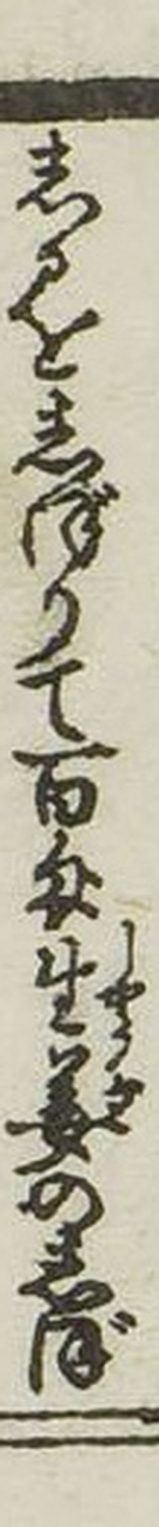しるをしぼりて百匁生姜のしぼ
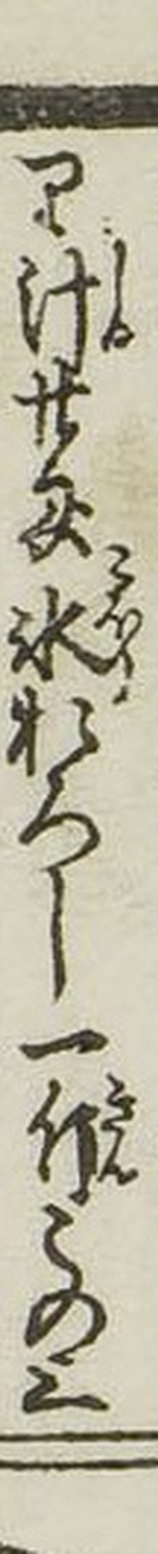り汁廿匁氷おろし一斤この三
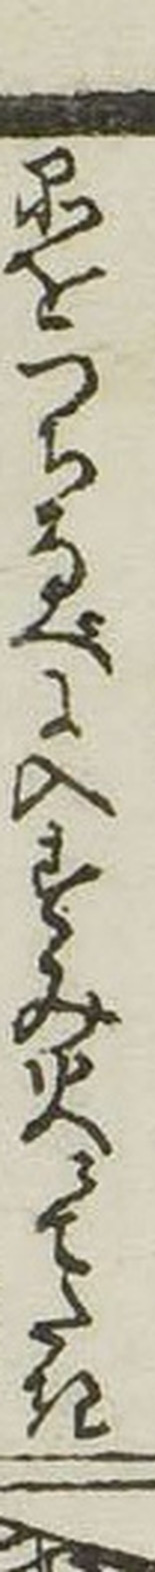品をつちなべに入すみ火にてたき
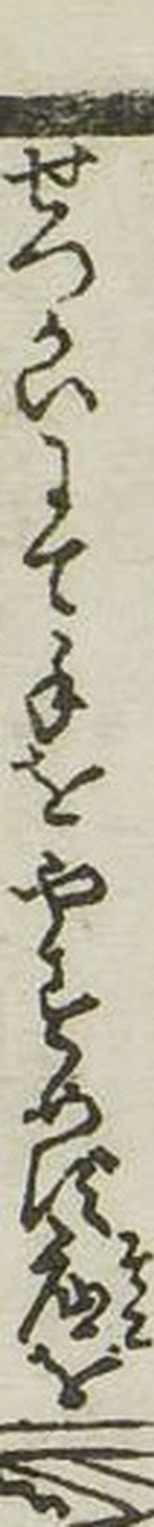せつかいにて手をやすめず底を
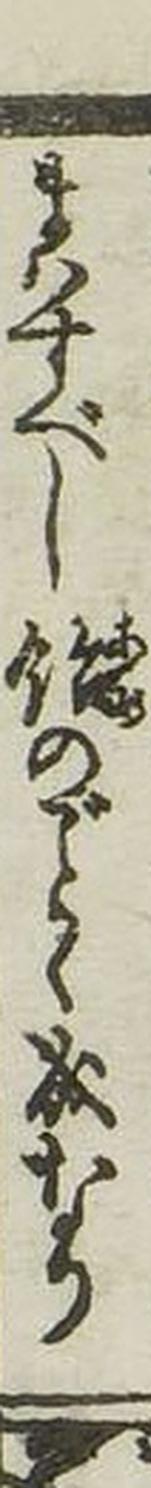まはすべし飴のごとく成なり

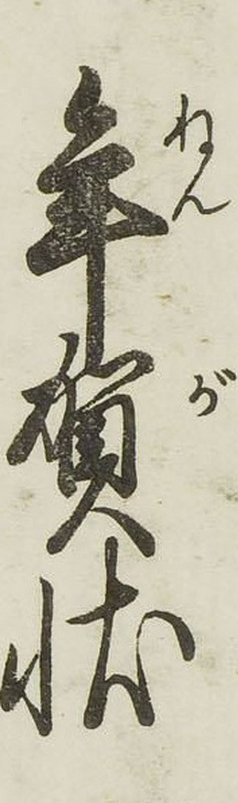年賀状
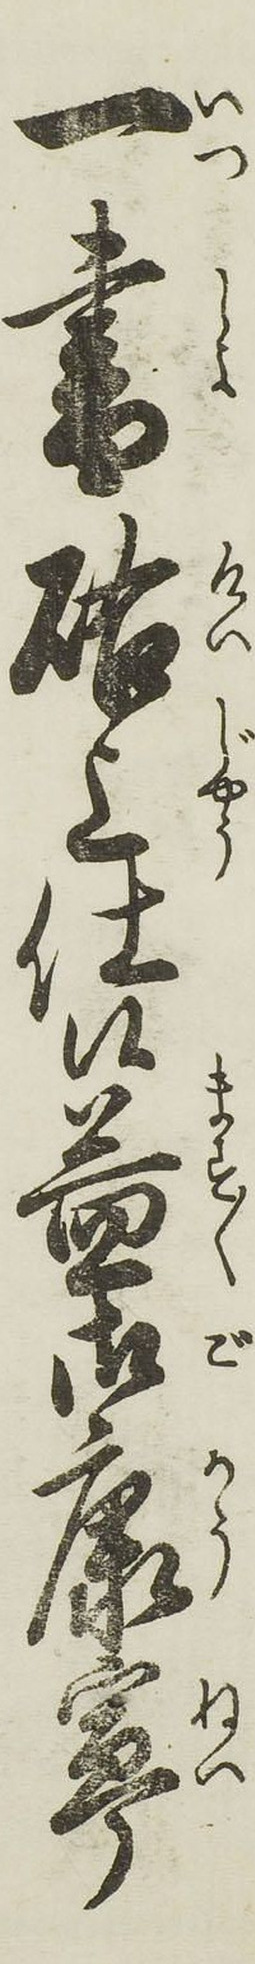一書啓上仕候益御康寧
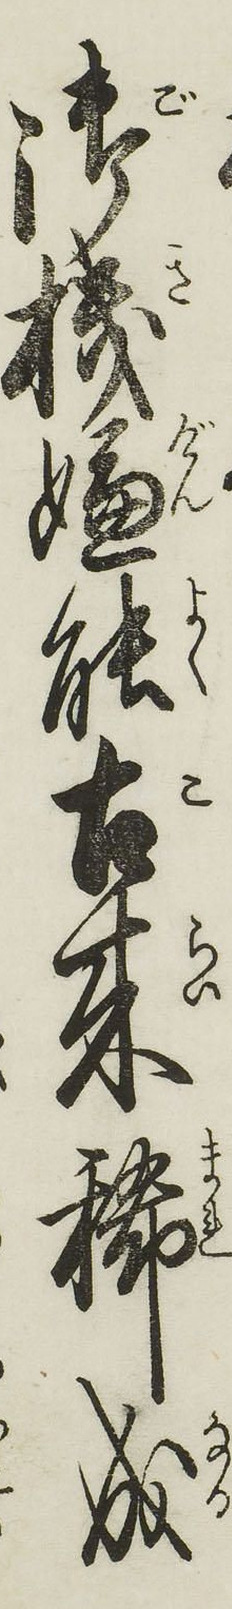御機嫌能古来稀成

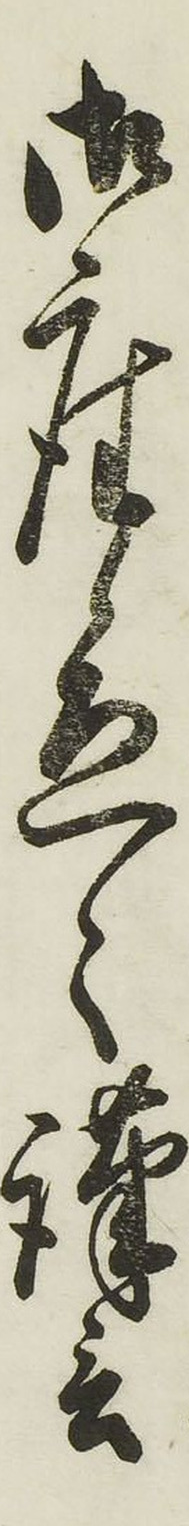御座候恐々謹言
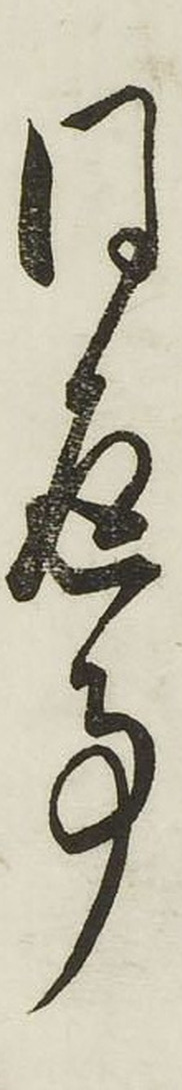同返事
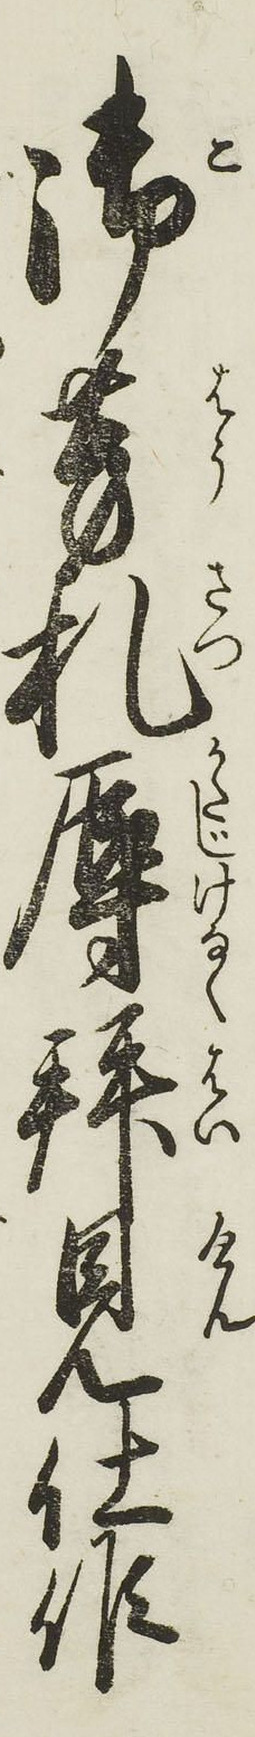御芳札辱拝見仕候
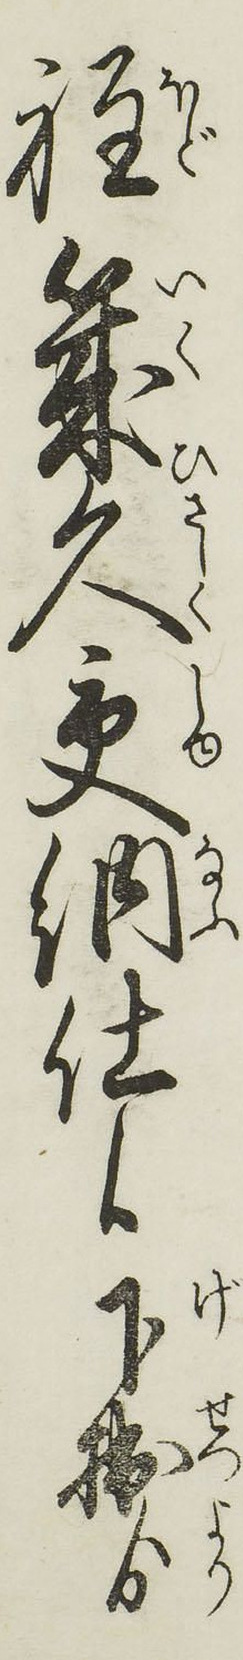程幾久受納仕候下拙ゟ

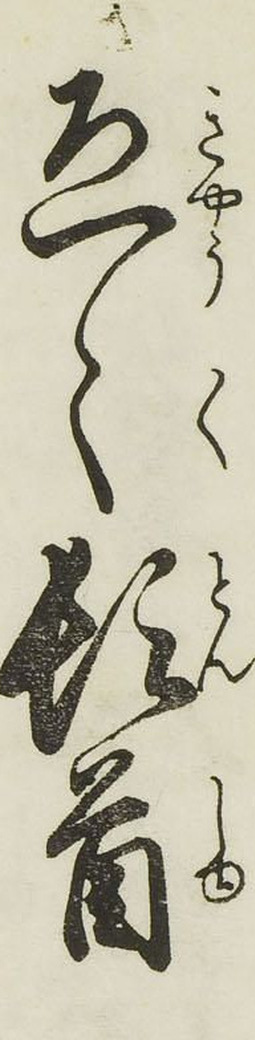恐々頓首
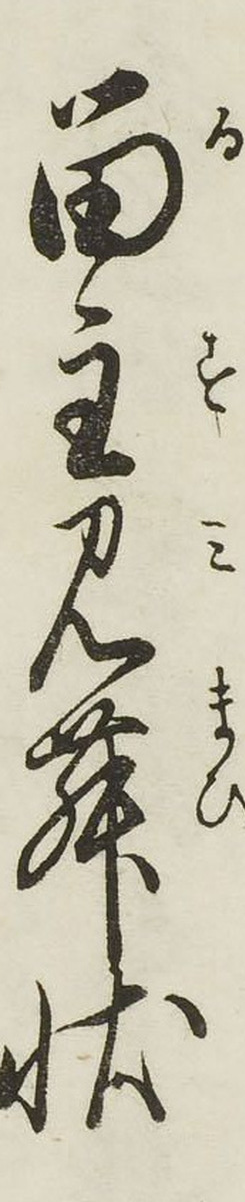留主見舞状
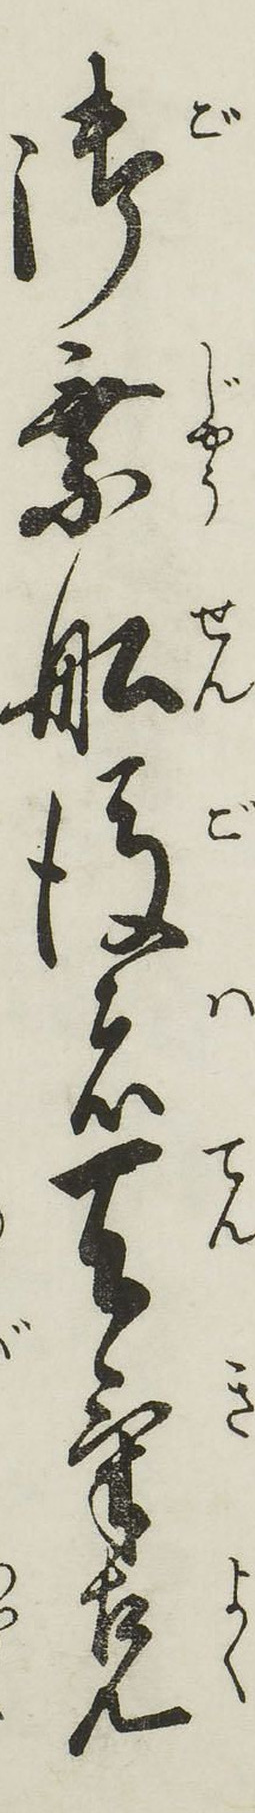御乗船後者天気克

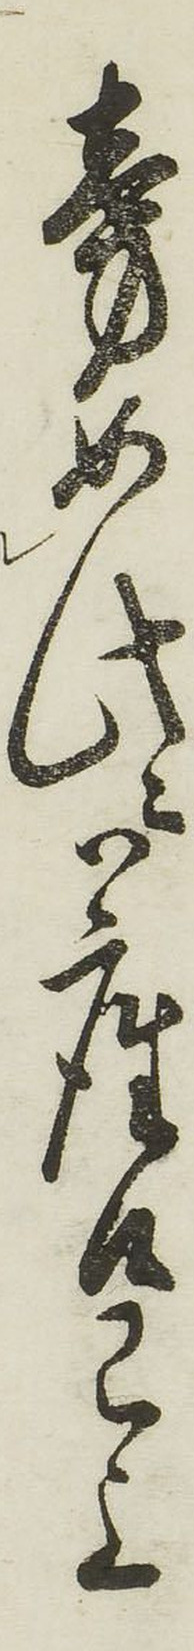旁如此御座候已上
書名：商人書翰便覧
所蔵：東京学芸大学教育コンテンツアーカイブ
